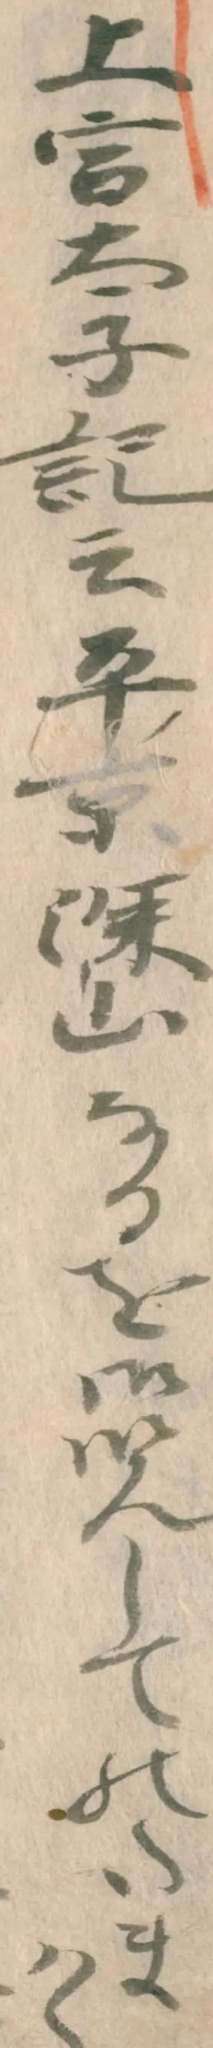上宮太子記云平京深-山なるを御覧してのたまはく
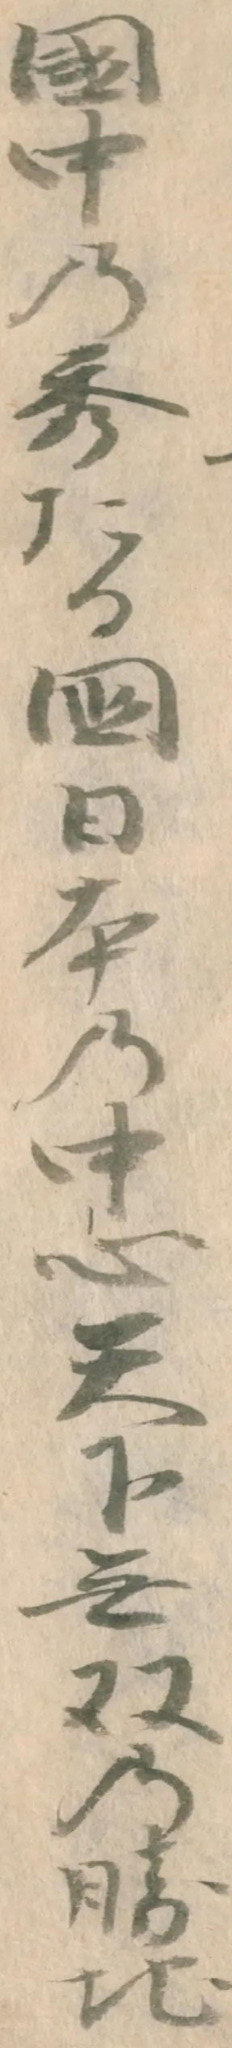国中の秀たる国日本の中心天下無双の勝地
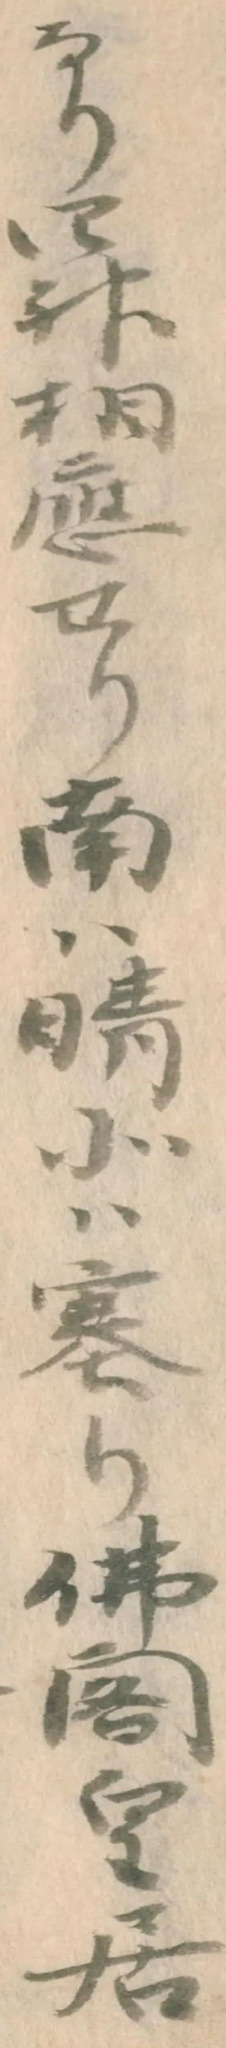なり四神相応せり南は晴北は塞り仏閣皇居
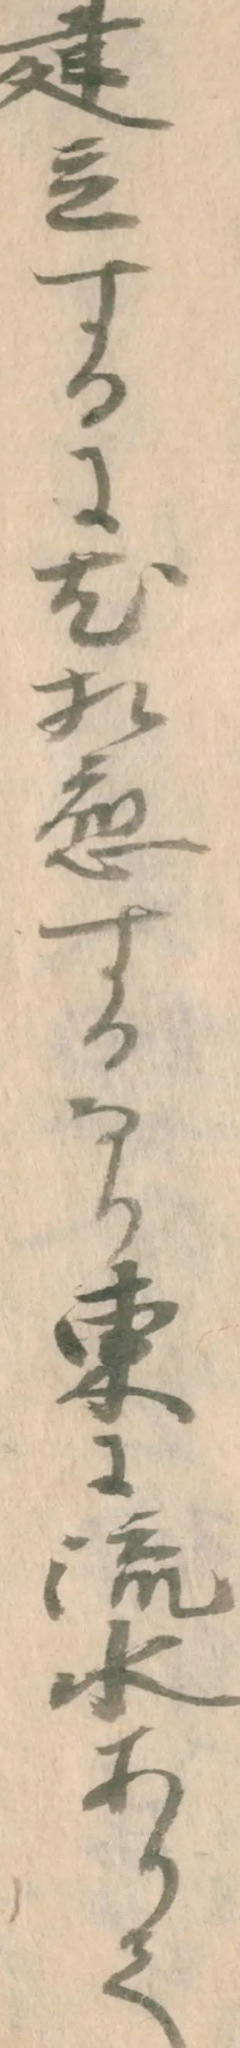建立するに尤相応するなり東に流水ありて
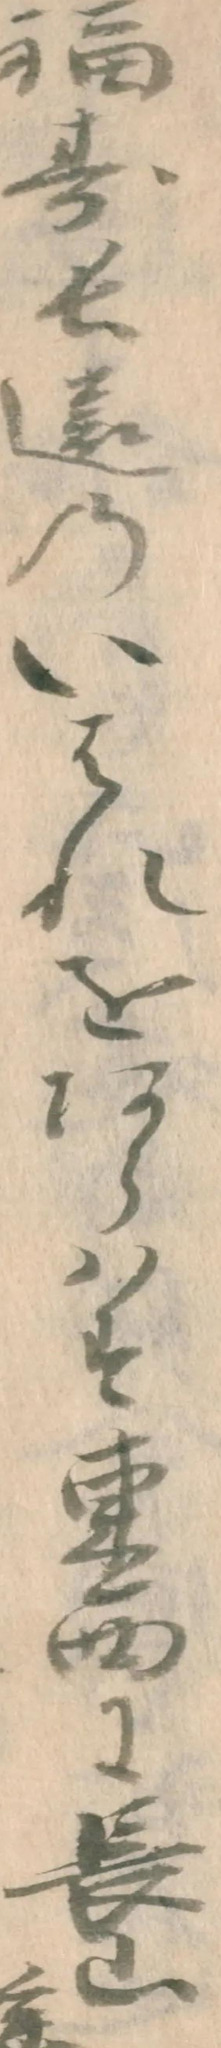福寿長遠のいはれをあらはす東西に長山遥
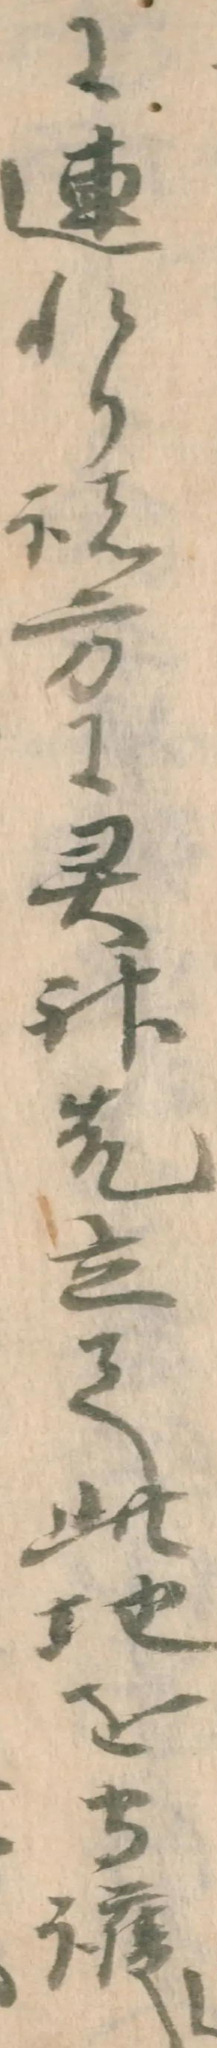に連れり諸方に霊神先立て此地を守護
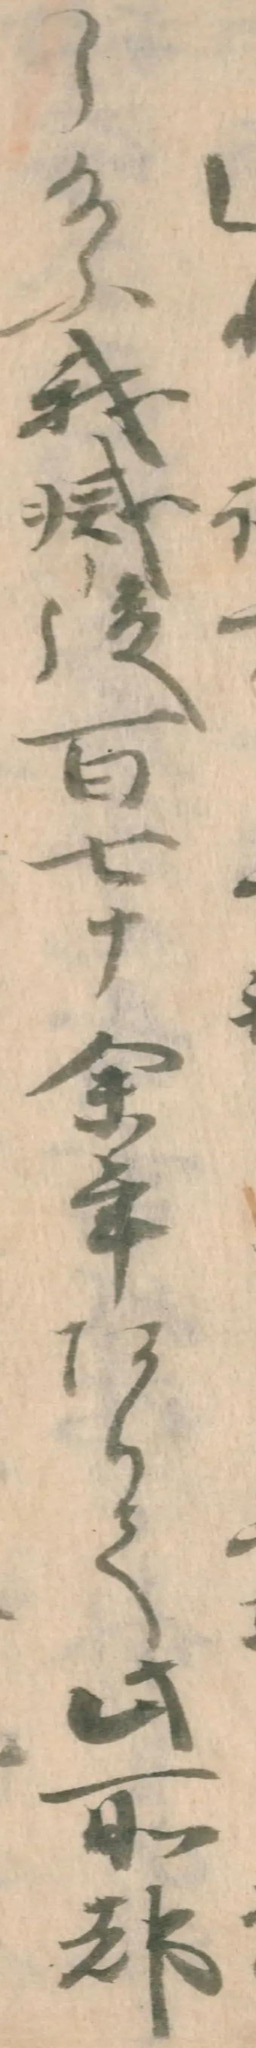し給ふ我滅-後百七十余年ありて此所都
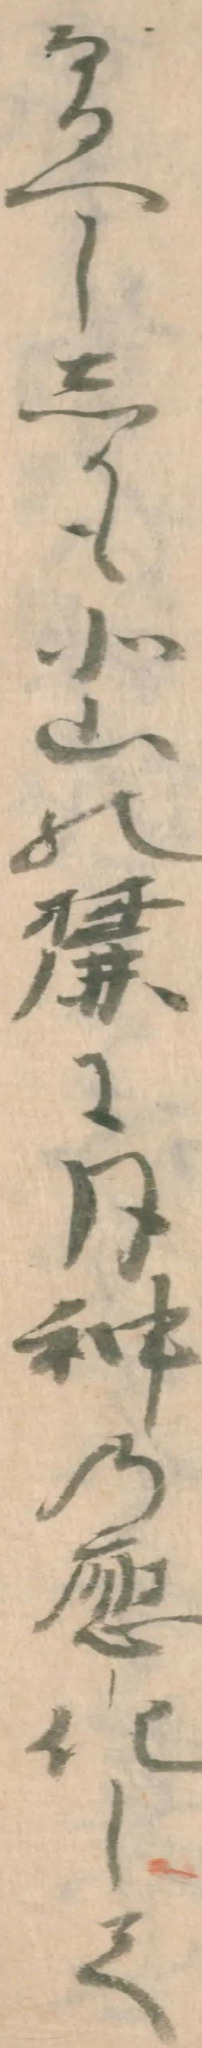なるへししかも北山の麓に月神の応-化して
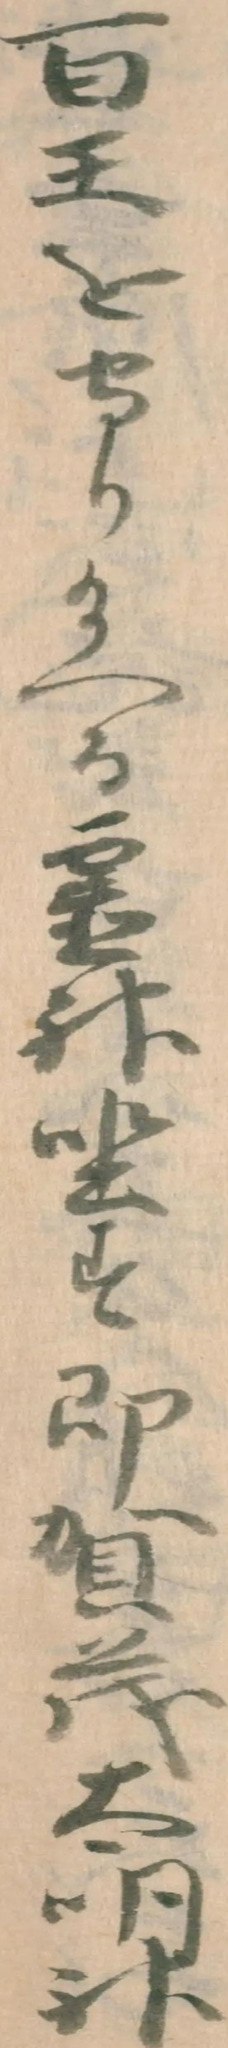百王を守り給へる霊神坐す即賀茂太明神
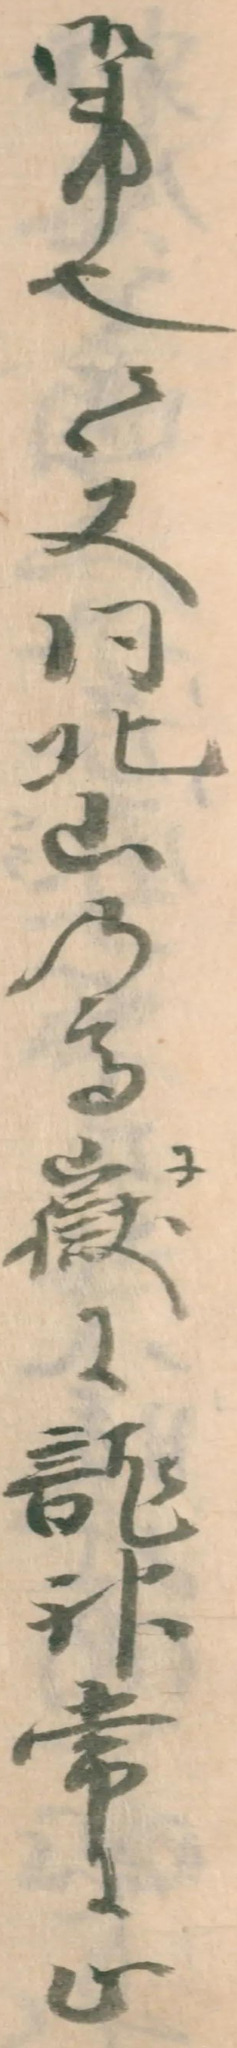御事也云々又同北山の高嶽に龍神常に止
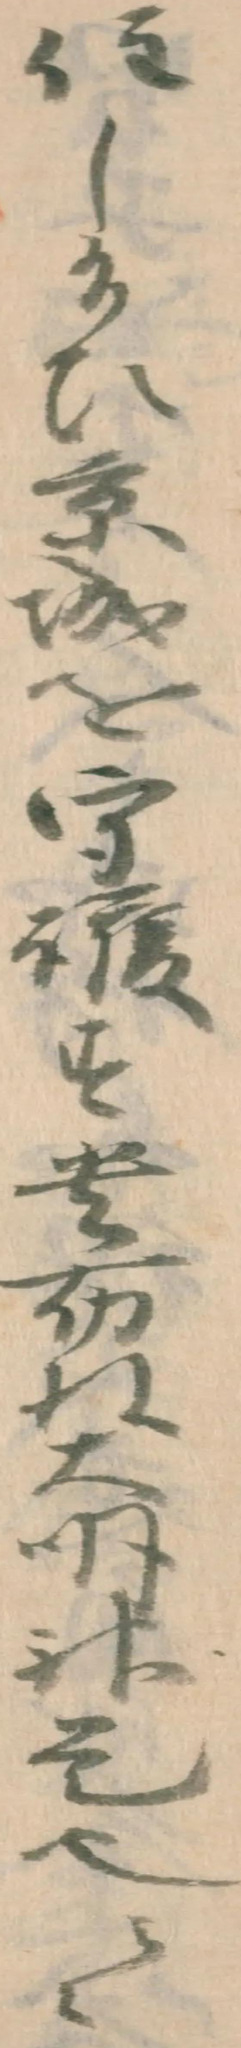住し給ひ京城を守護す貴ふね大明神是也云々
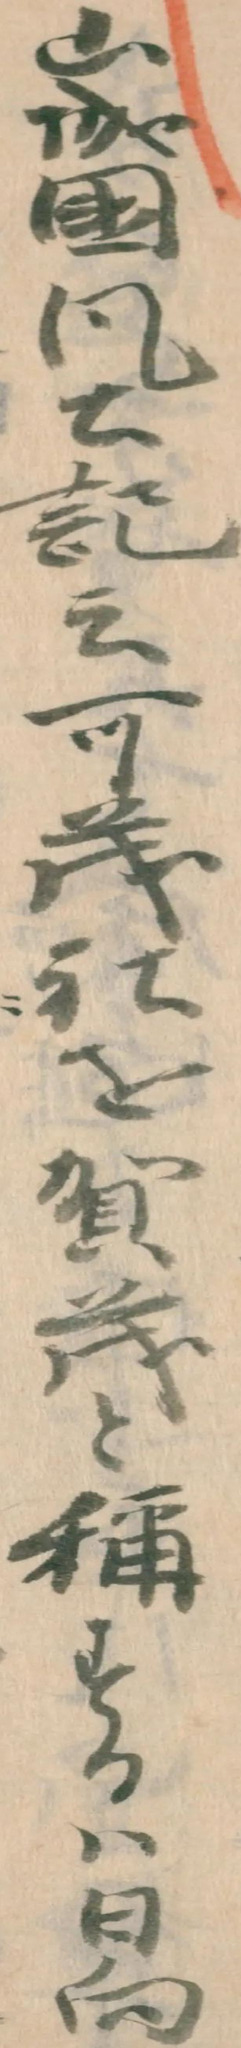山城国風土記云可茂社を賀茂と称するは日向
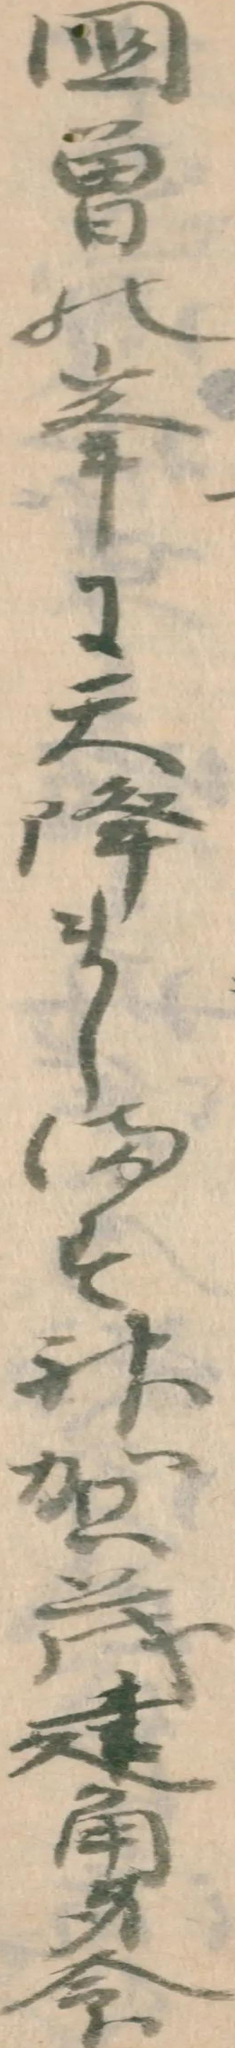国曽の峯に天降まします神賀茂建角身命
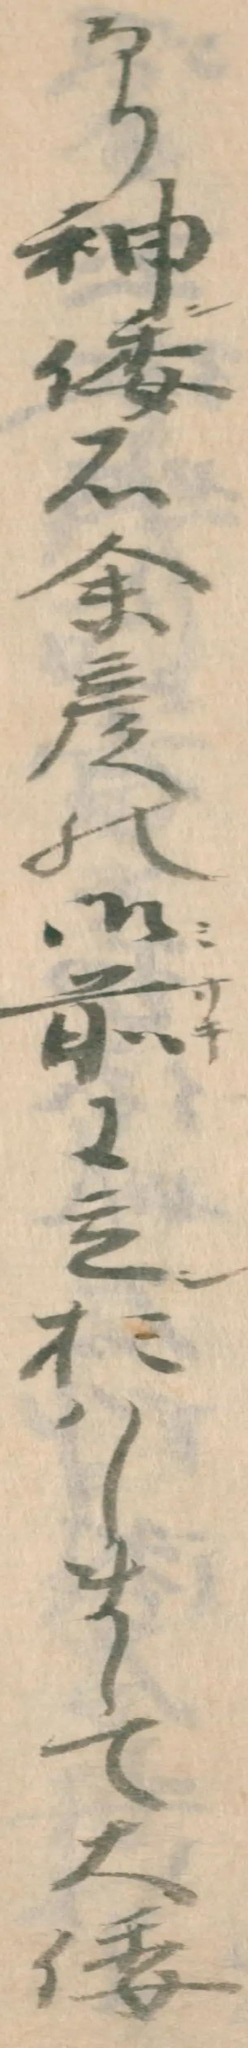なり神倭石余彦の御前に立大倭
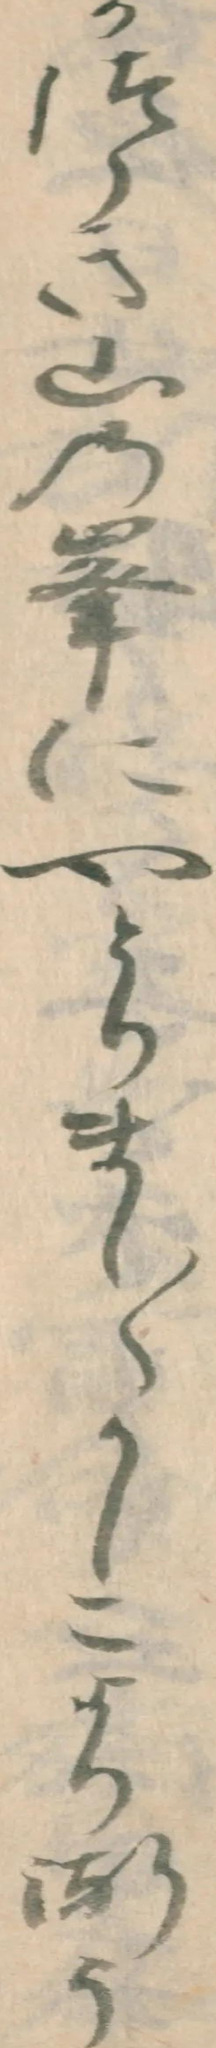かつらき山の峯にやとりまし〳〵かしこより漸う
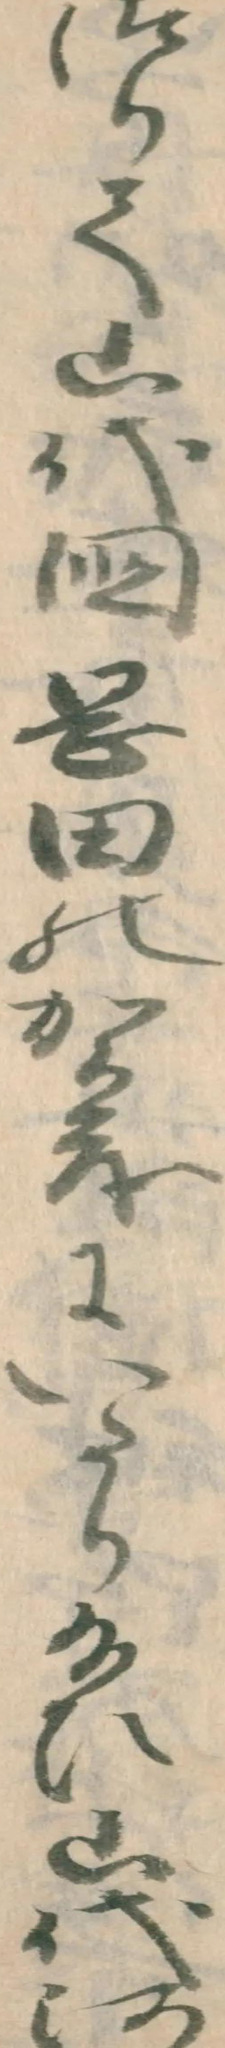つりて山代国岡田の賀茂にいたり給ひ山代河
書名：賀茂社記録. 第1冊
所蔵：国立国会図書館 National Diet Library, JAPAN
